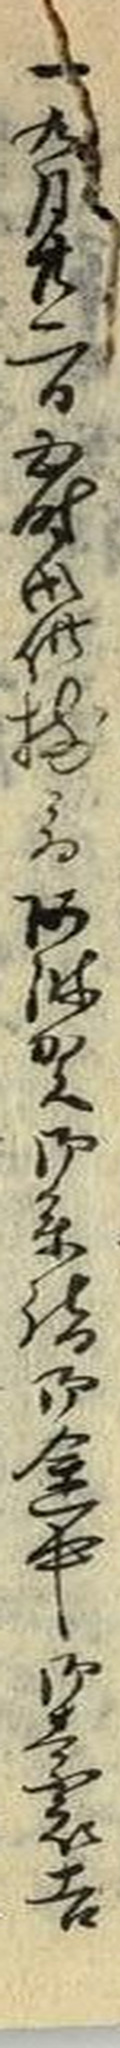一九月廿二日五時御供揃ニ而阿波賀御参詣御途中御素衣吉
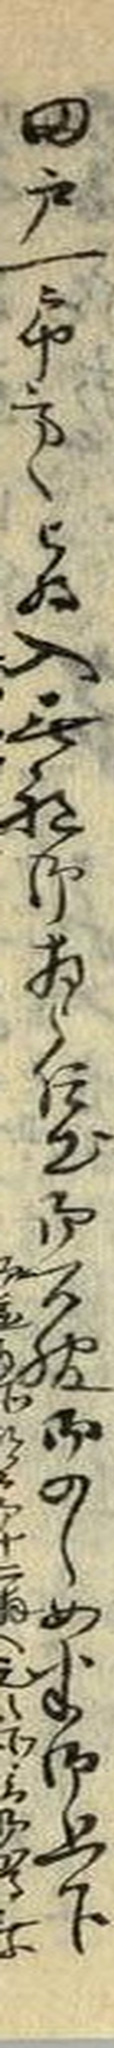田戸一郎方へ被為入無程御拝被仰出御召服御のしめ半御上下
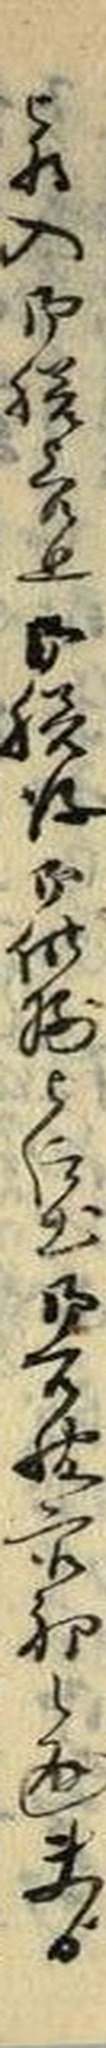被為入御膳被召上御膳後御供揃被仰出御召服最初之通夫ゟ
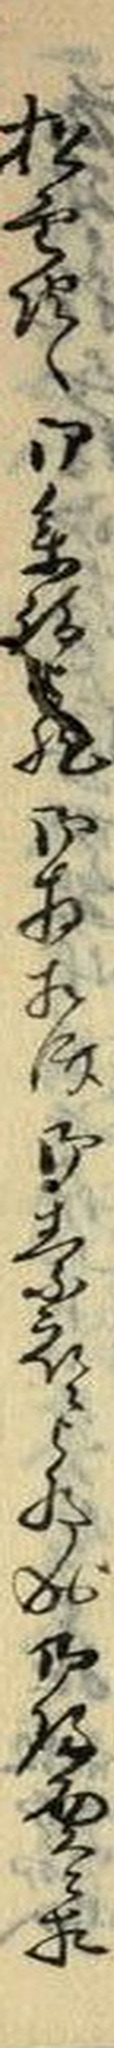松雲院へ御参詣被遊御拝相済御素衣ニ被為成御帰殿ニ相
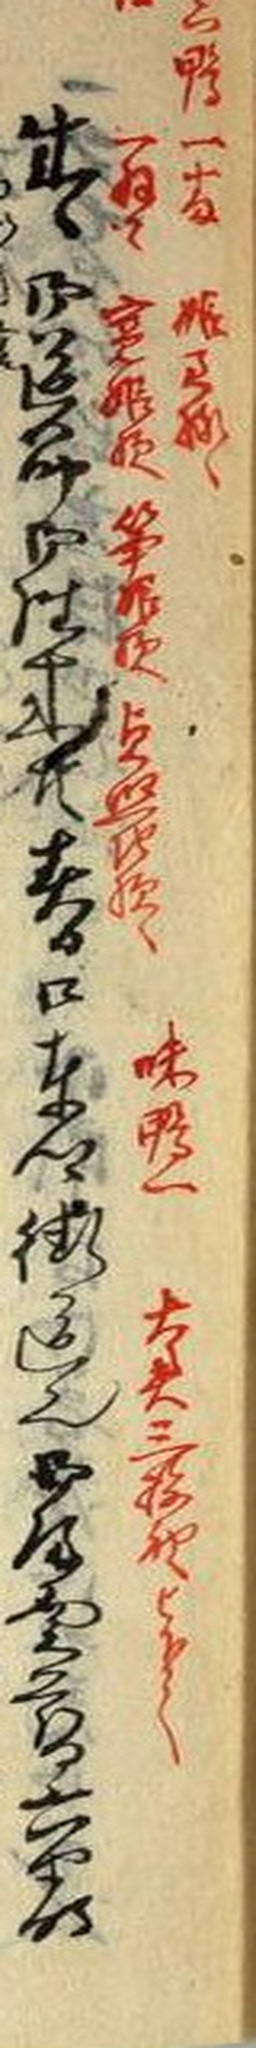成候御道筋御往来共春日口東郷街道也御帰殿暮六半時
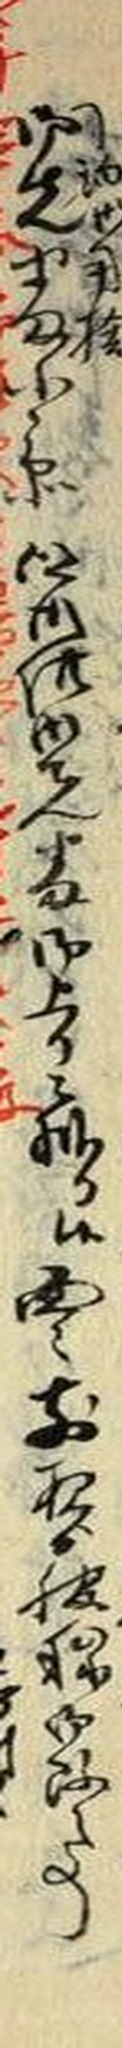泊御用捨御先番小兵衛但御供御先番御上りニ掛り候面々前夜ゟ服穢御改之事
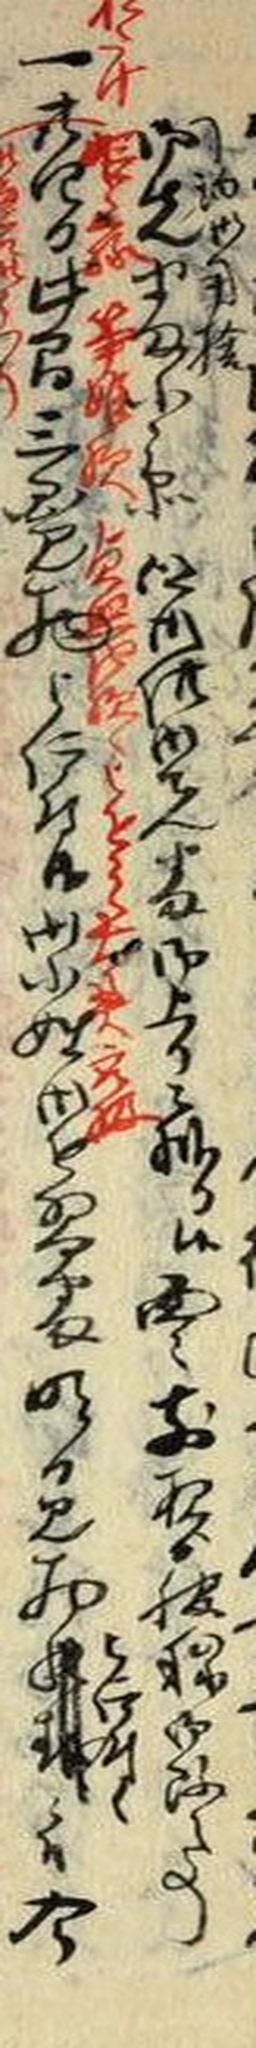一廿四日此間三国見物被仰付候御小姓御近習番明日見物被仰付候ニ付今
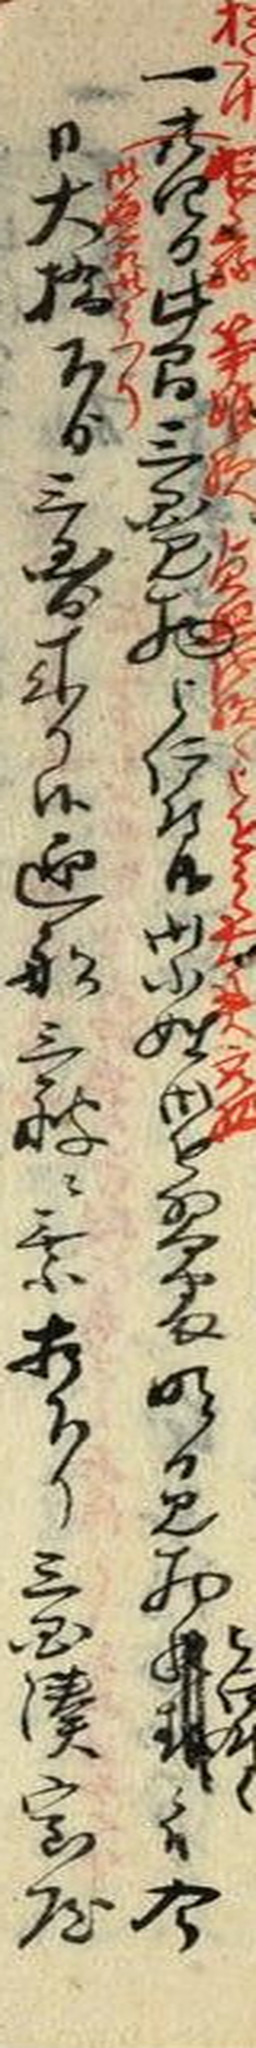日大橋下ゟ三国ゟ来り候迎船三艘ニ乗相下り三国湊室屋
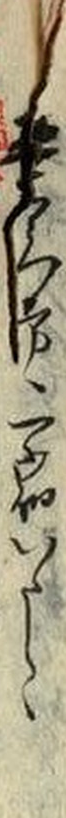惣右衛門方へ一宿いたし候
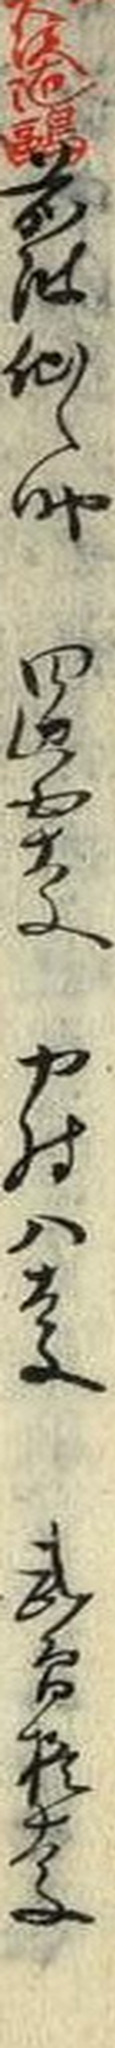前波他之助田辺五太夫中村八太夫武曽権太夫丞
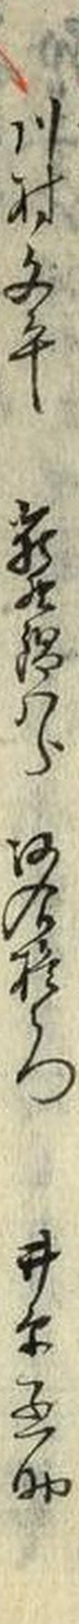川村文平荻野鍋八郎河合権右衛門井原丞助
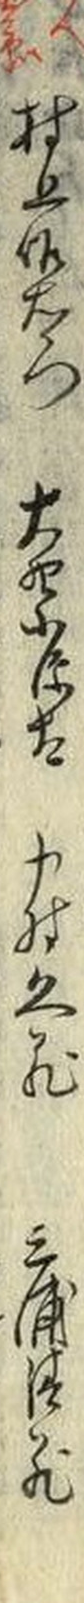村上作右衛門大野小源太中村久蔵三浦清蔵
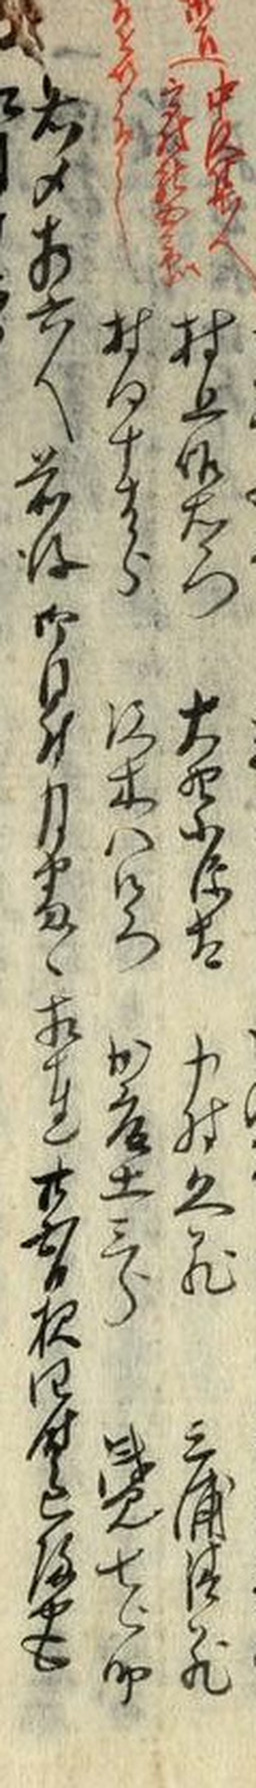村田十太郎沢木八左衛門加藤土三郎浅見七郎助
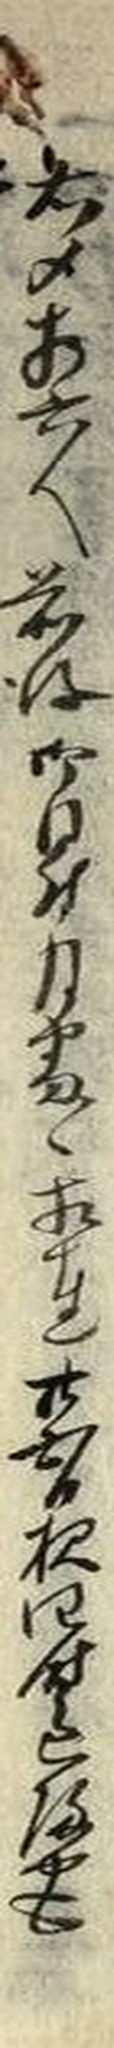右〆拾六人前後御目付月番へ相達廿五日夜四時過帰宅
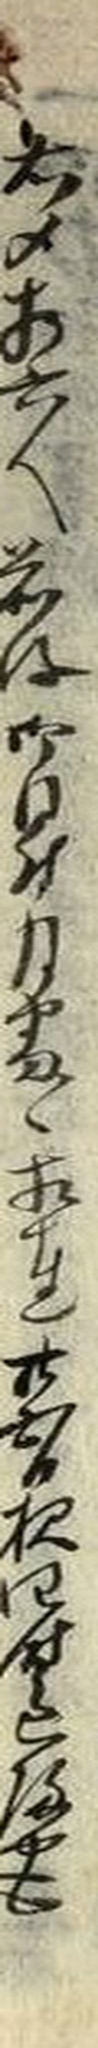右〆拾六人前後御目付月番へ相達廿五日夜四時過帰宅
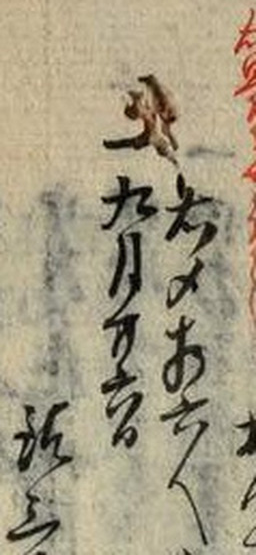一九月廿六日
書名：少傅日録抄（斉承付側向頭取日記、在国）
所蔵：福井県文書館 Fukui Prefectural Archives
